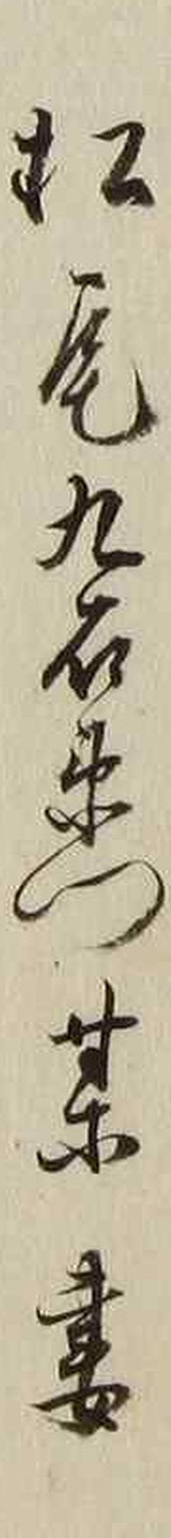女松尾九右衛門某妻
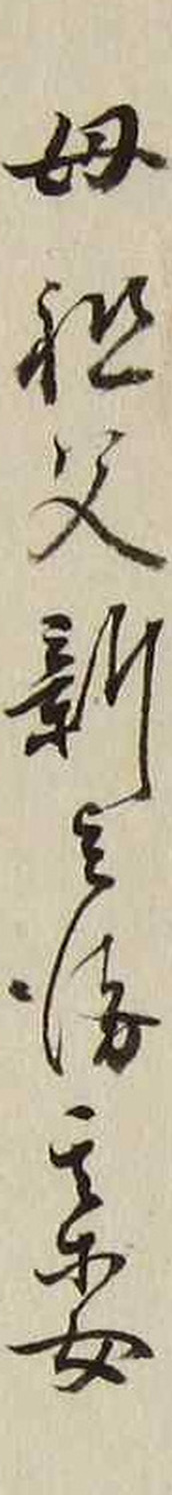母祖父新兵衛某女
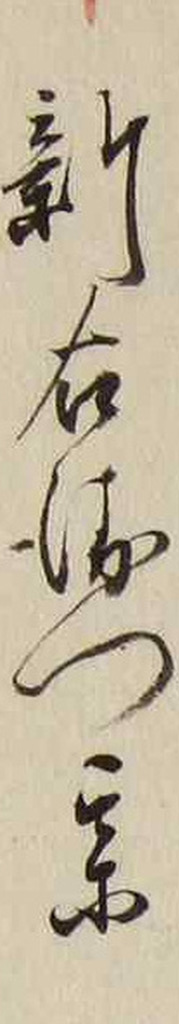新右衛門某

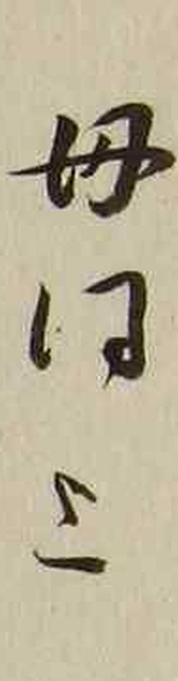母同上
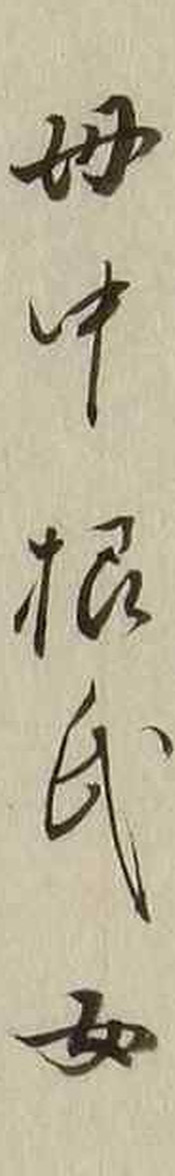母中根氏女
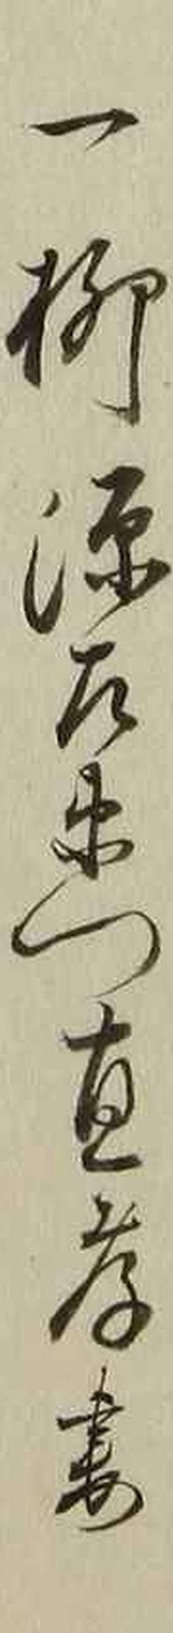女一柳源左衛門直孝妻
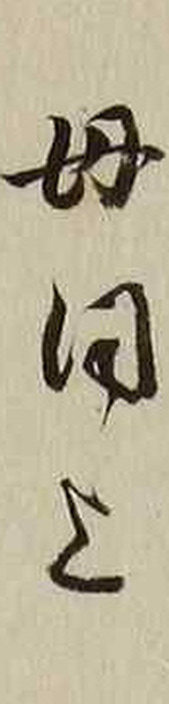母同上
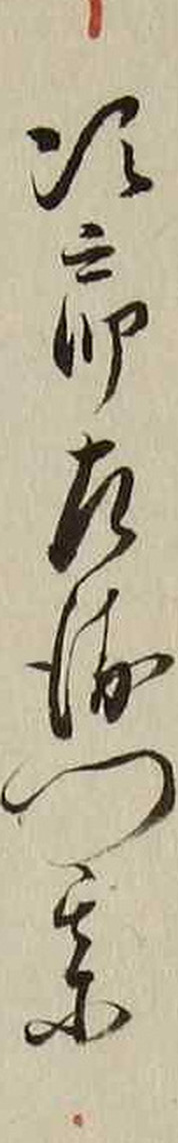次郎左衛門某
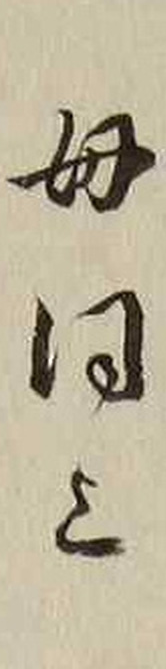母同上
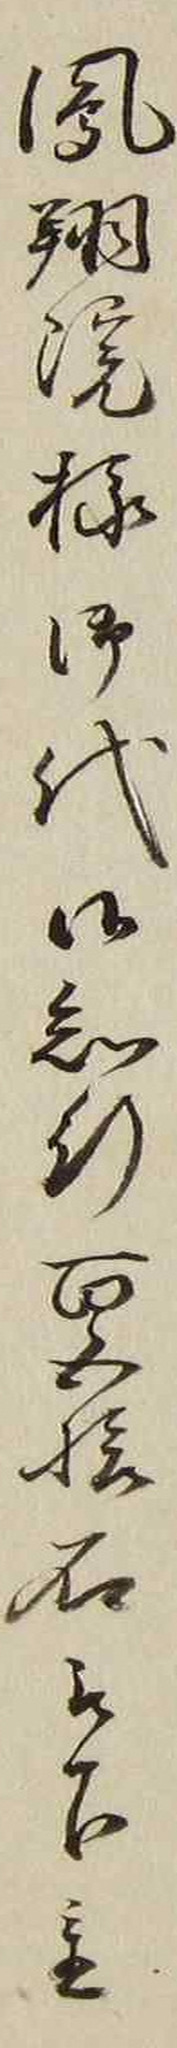鳳翔院様御代御知行百五十石被下置
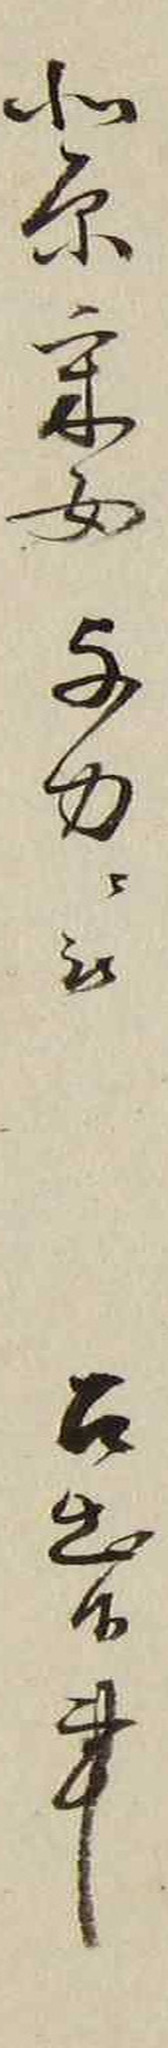北原采女与力に被召出候事

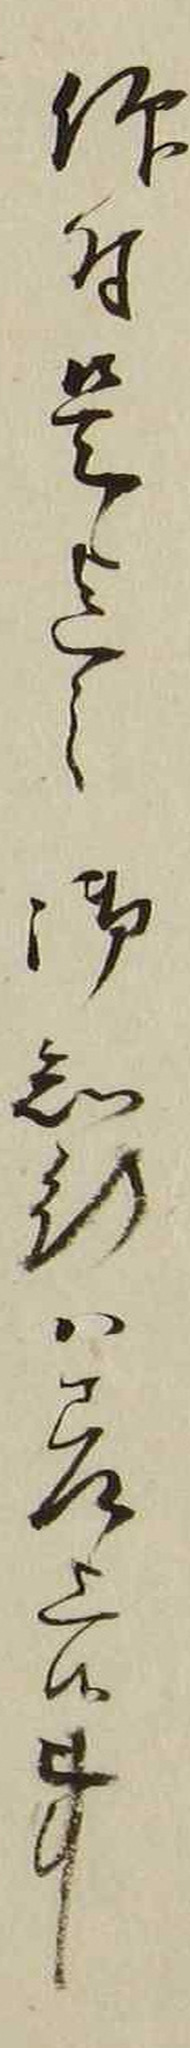仰付是迄之御知行は差上候事
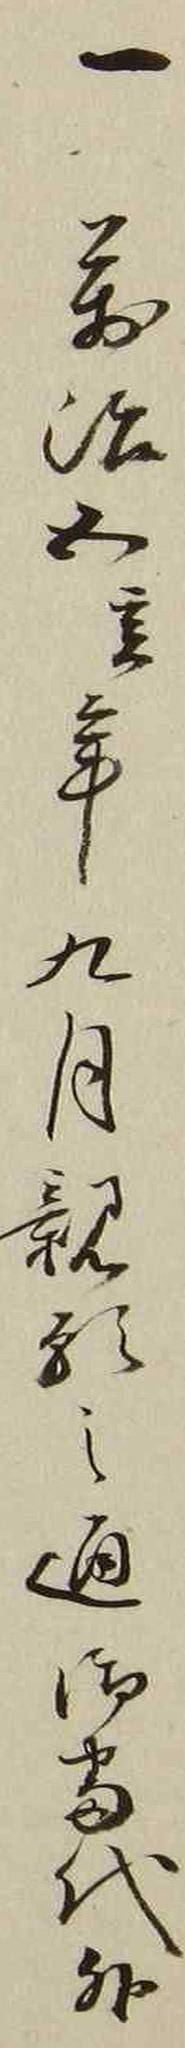一万治五亥年九月親願之通御当代外
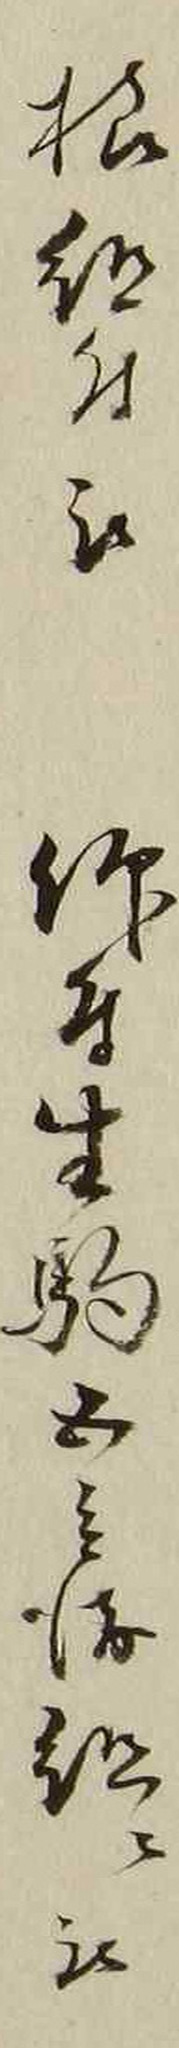様組付被仰付生駒五兵衛組に被
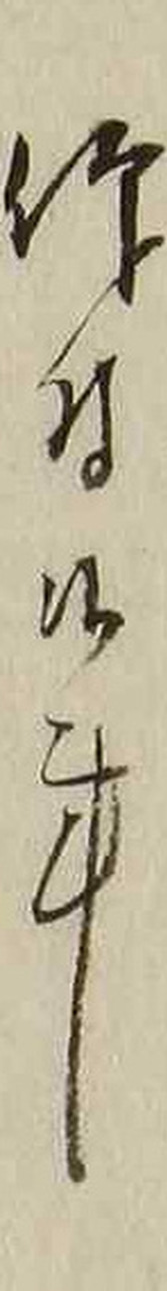仰付候事
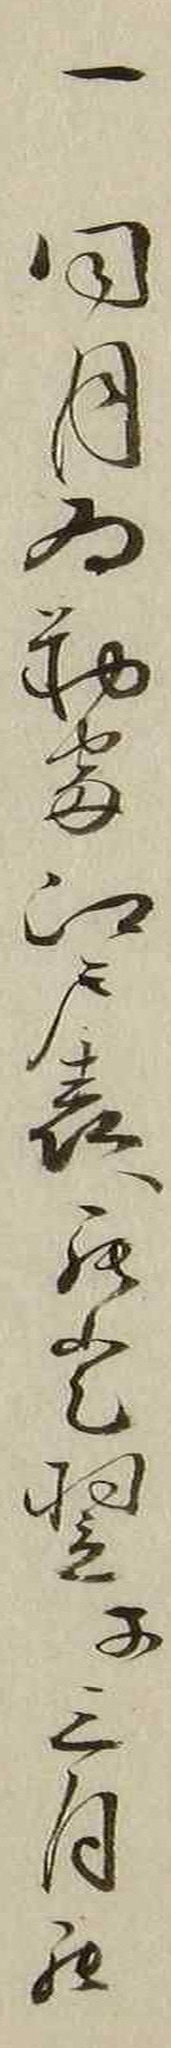一同月為勤番江戸表へ罷登翌子三月罷
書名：諸士系譜　巻之170　な之部12
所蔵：会津若松市立会津図書館
